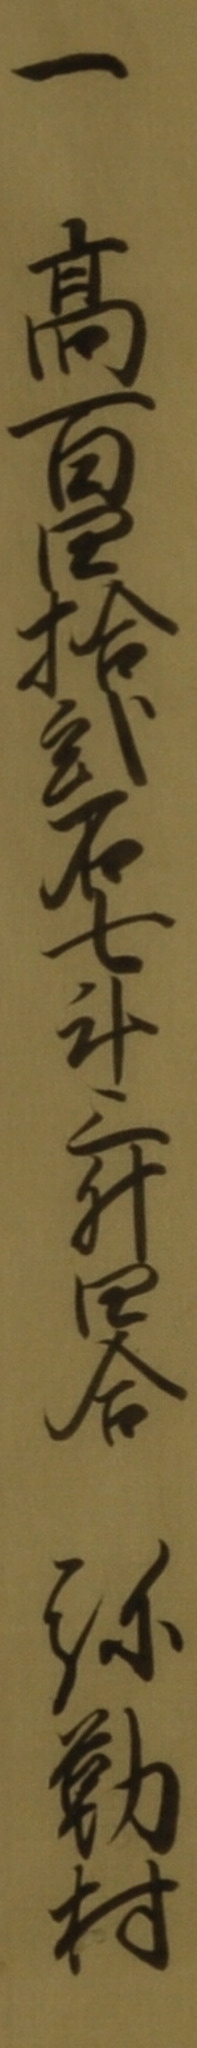一高百四拾弐石七斗三升四合弥勒村
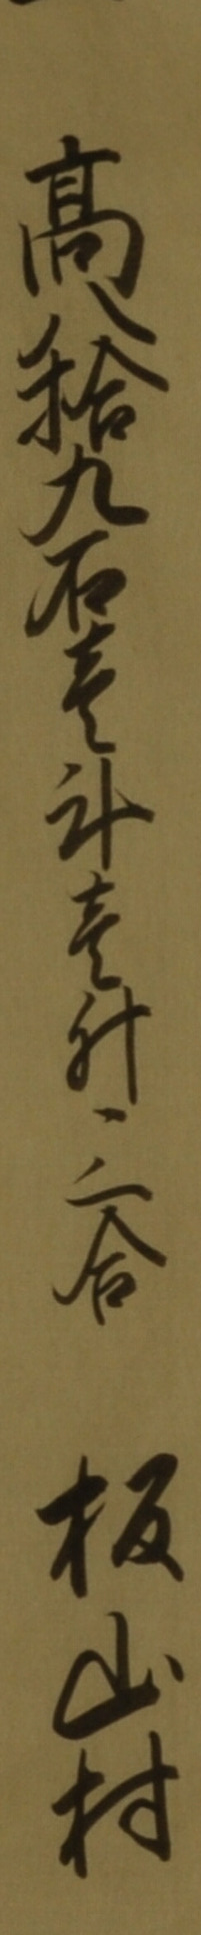一高八拾九石壱斗壱升三合板山村
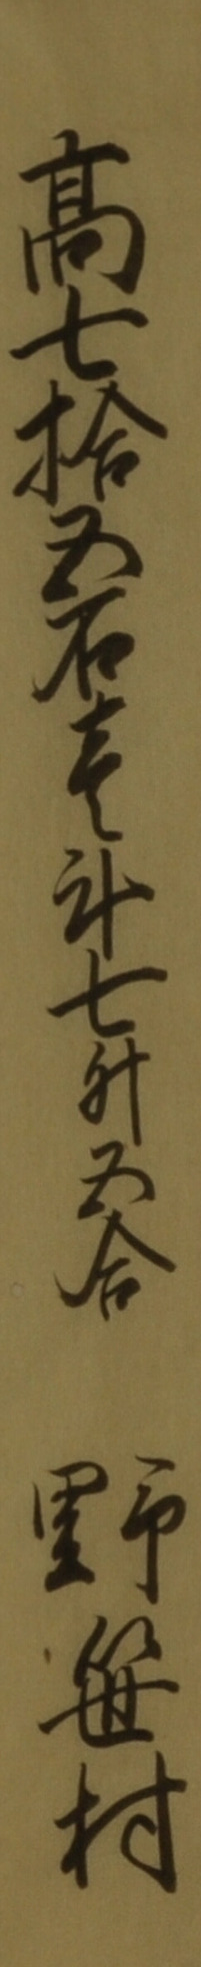一高七拾五石壱斗七升五合野笹村
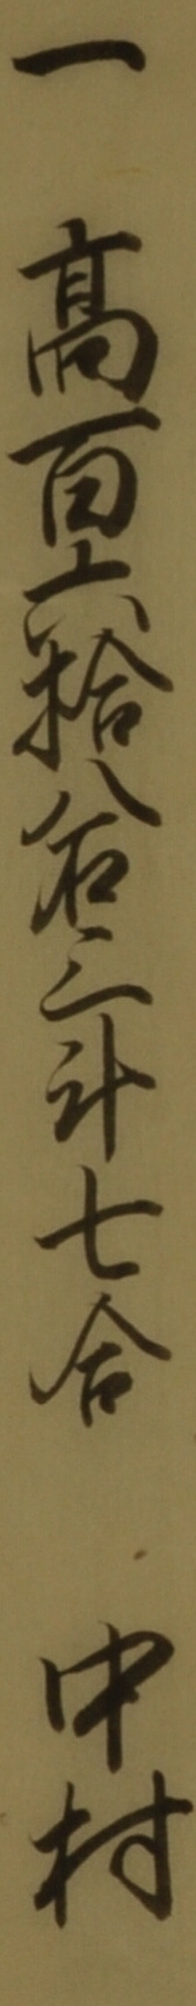一高百六拾八石三斗七合中村
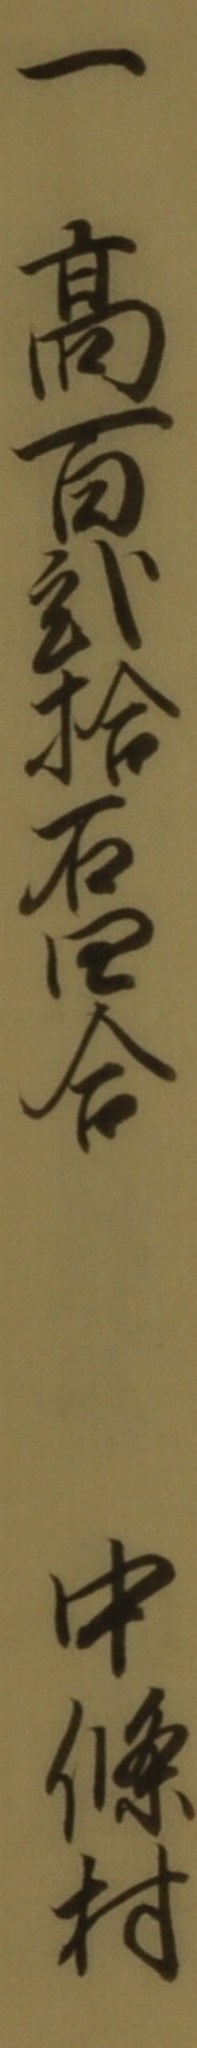一高百弐拾石四合中条村
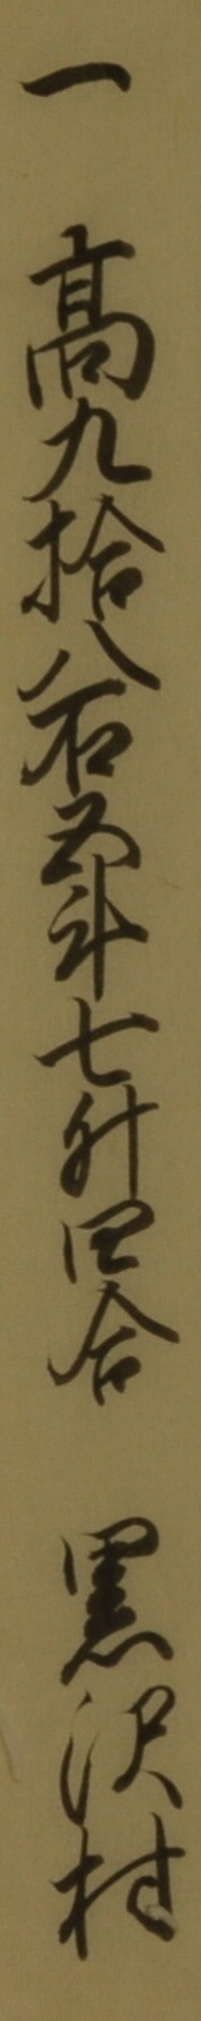一高九拾八石五斗七升四合黒沢村

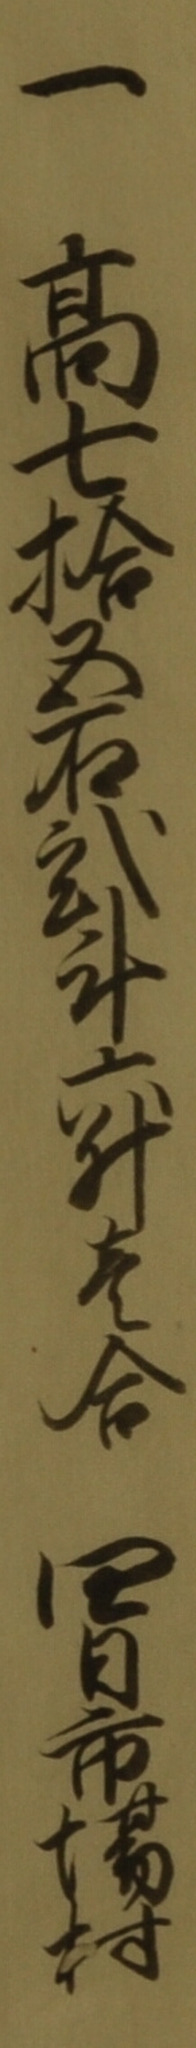一高七十五石弐斗六升壱合四日市場村
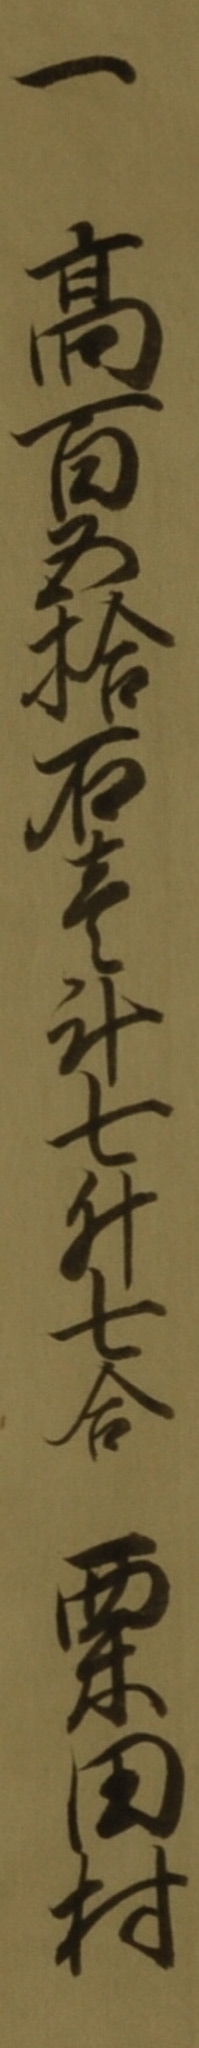一高百五拾石壱斗七升七合栗田村
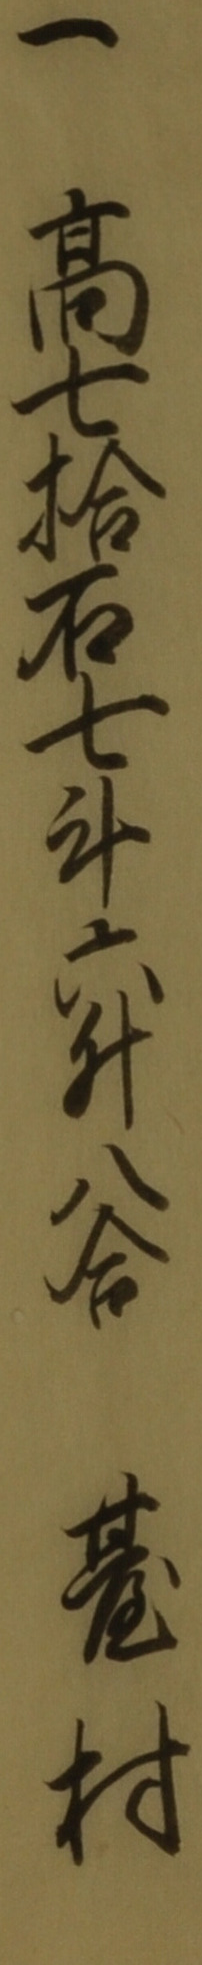一高七拾石七斗六升八合台村
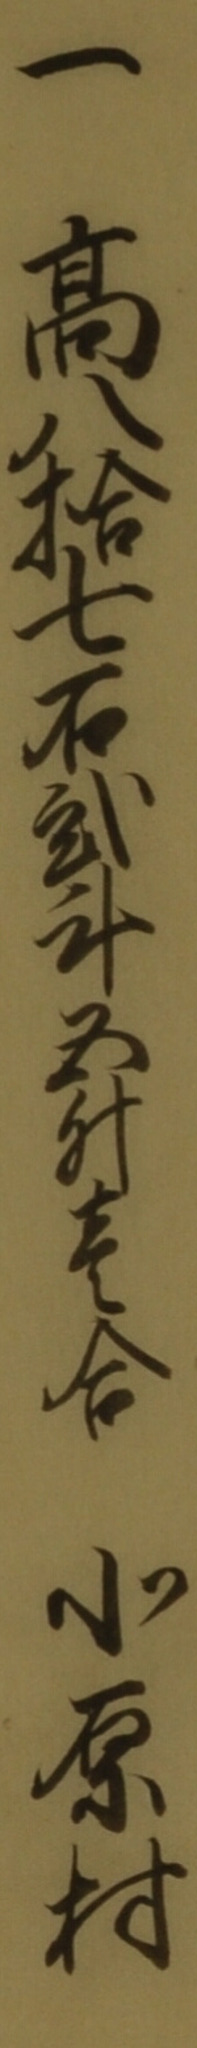一高八拾七石弐斗五升壱合北原村
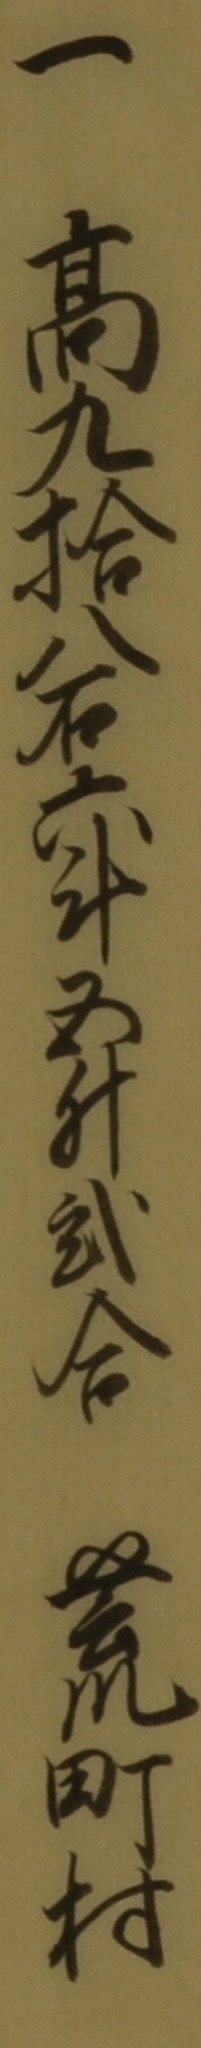一高九拾八石六斗五升弐合荒町村
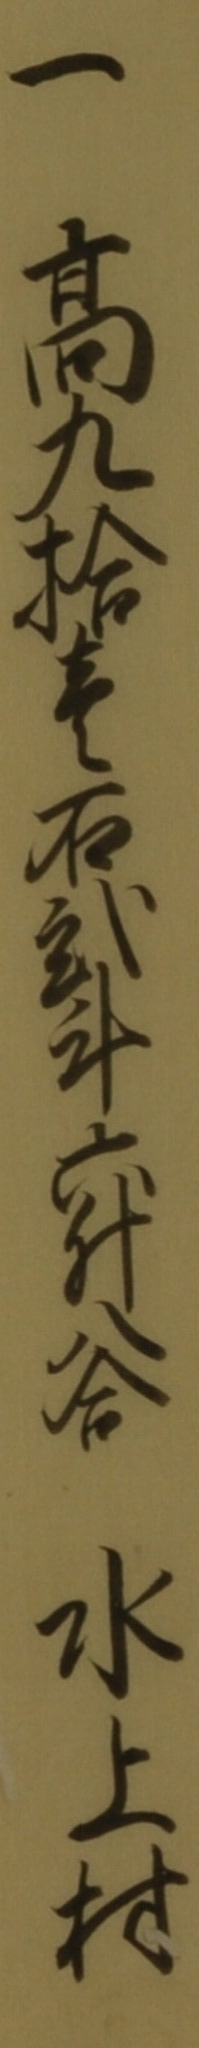一高九拾壱石弐斗六升八合水上村

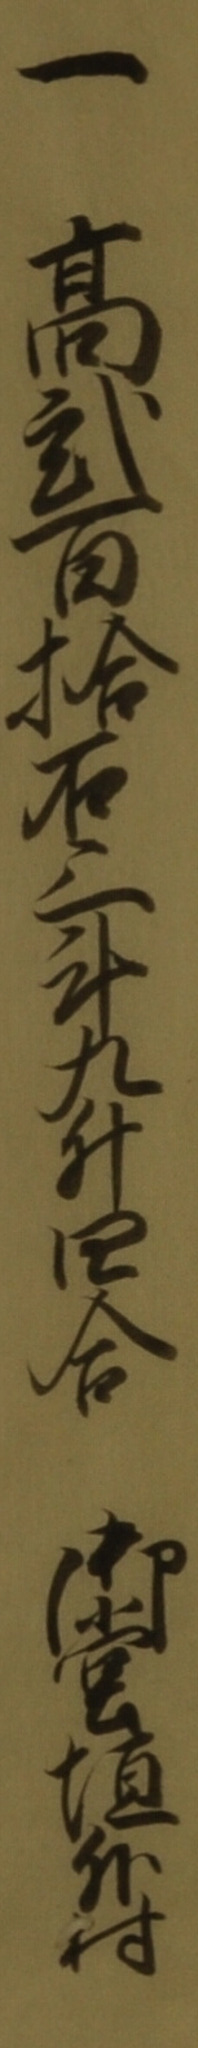一高弐百拾石三斗九升四合御堂垣外村
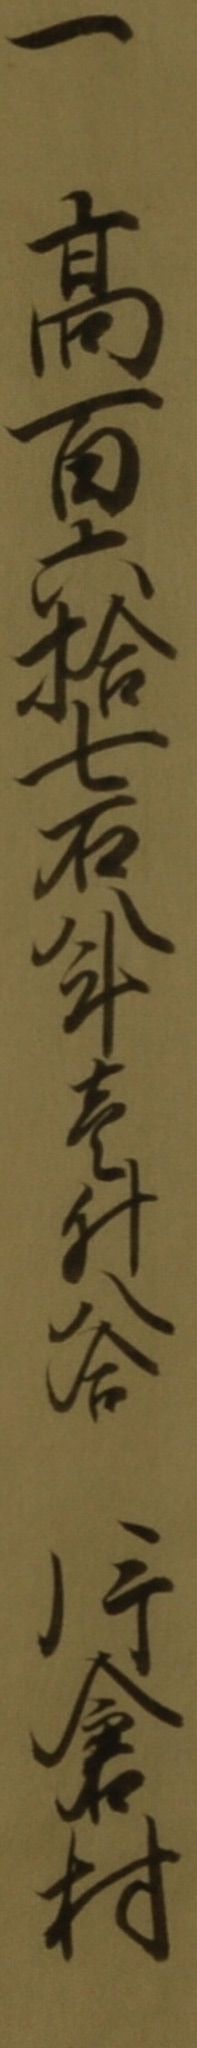一高百六拾七石八斗壱升八合片倉村
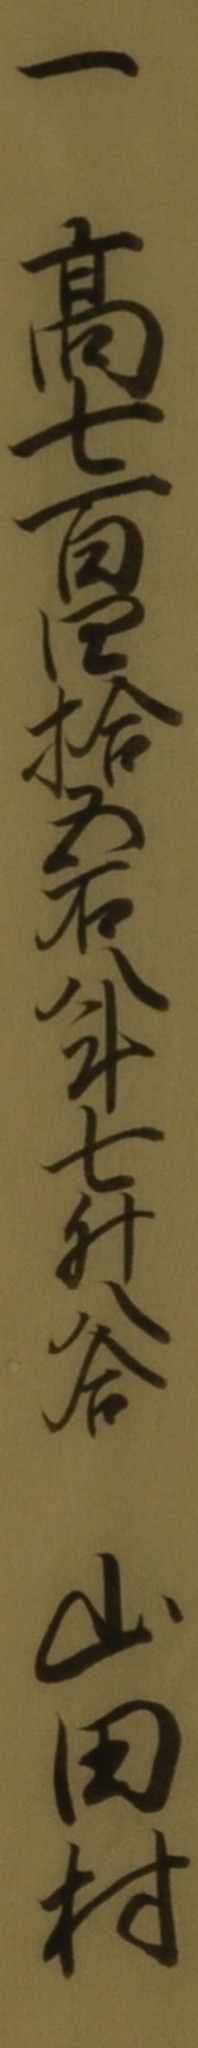一高七百四拾五石八斗七升八合山田村
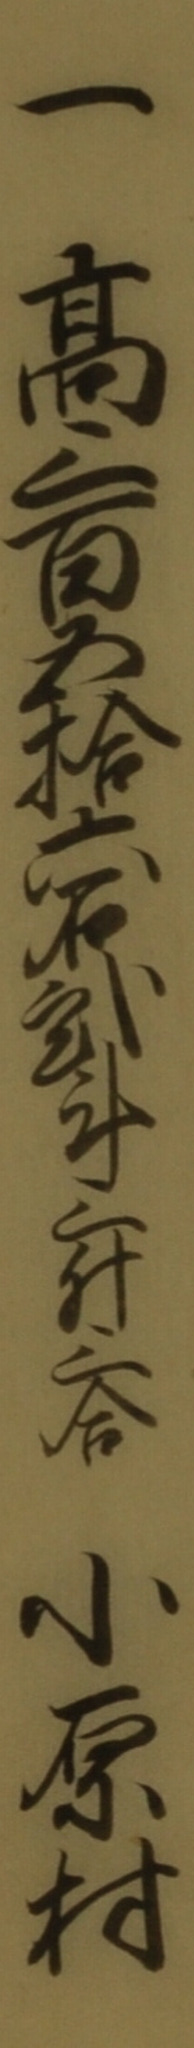一高三百五拾六石弐斗三升三合小原村
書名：信濃国伊那郡筑摩郡高遠領知郷村高辻帳
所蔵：伊那市立高遠町図書館・合同会社AMANE
